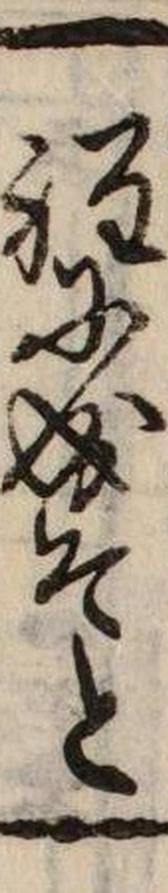程に成そと
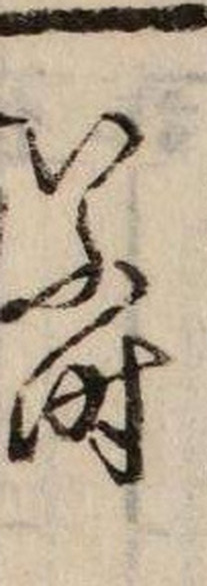いふ時
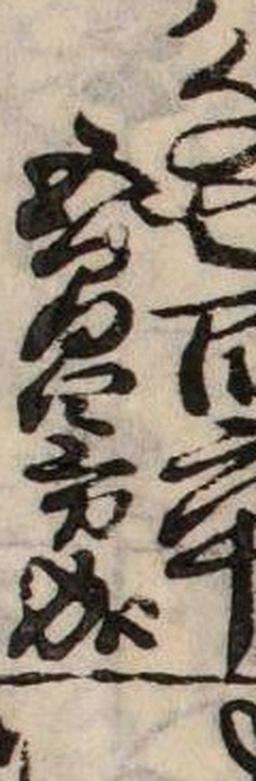五間四方成

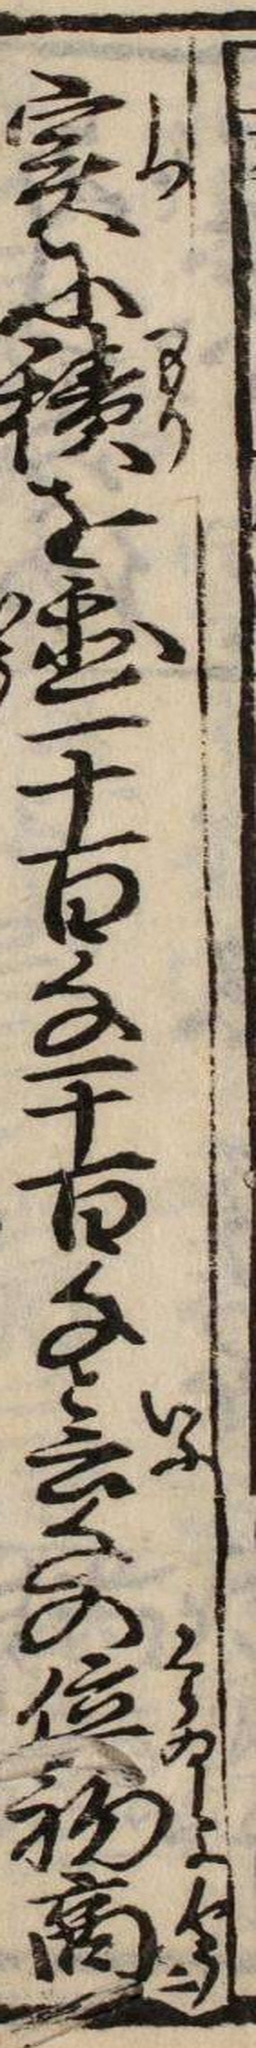実に積を置一十百千一十百千と云千の位初商に
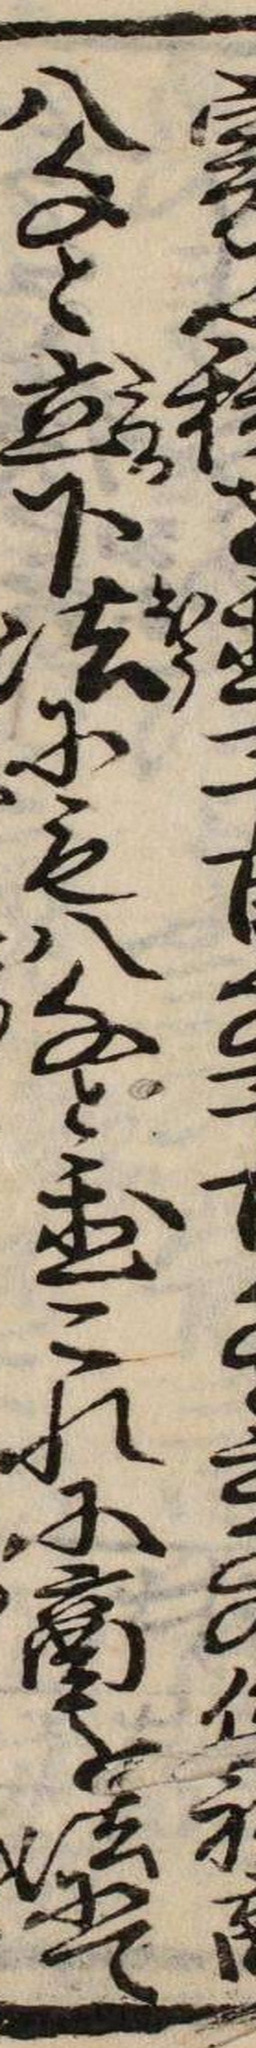八千と立下法にも八千と置これに商を法にて
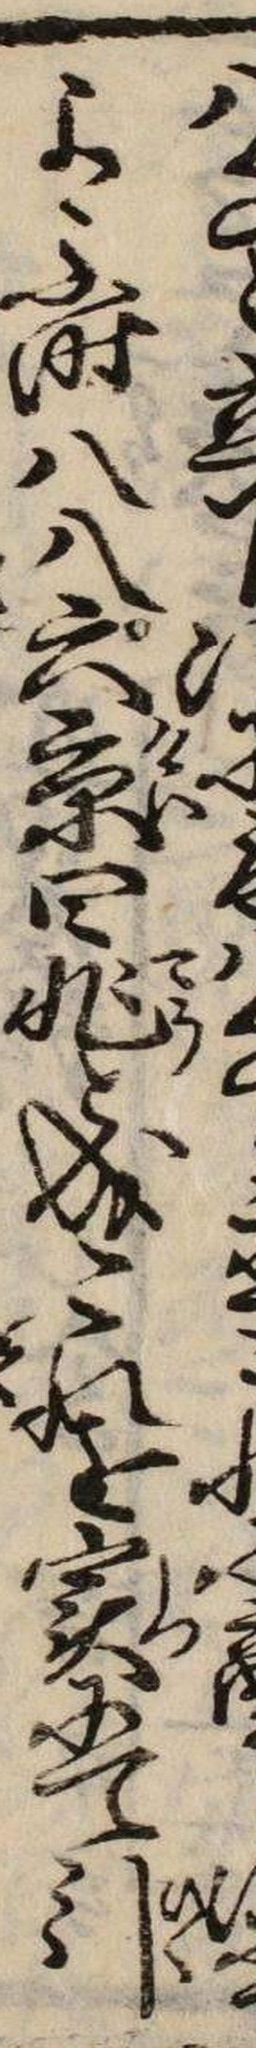よふ時八八六京四兆と成これを実にて引
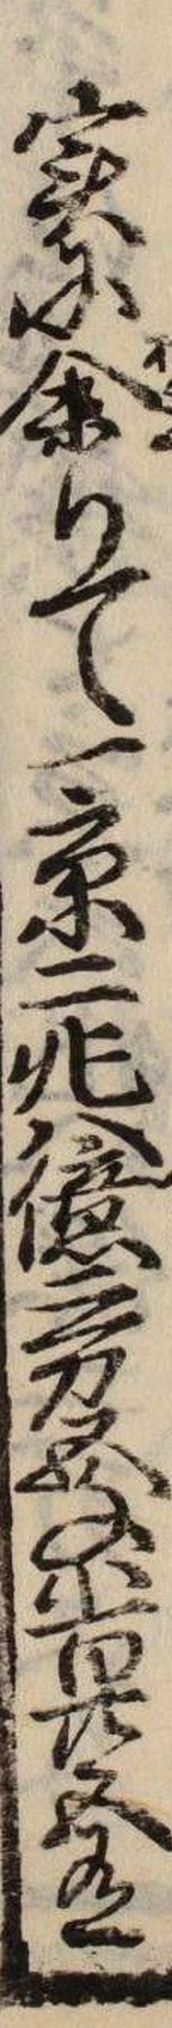実に余りて一京二兆八億二万五千弐百廿五有
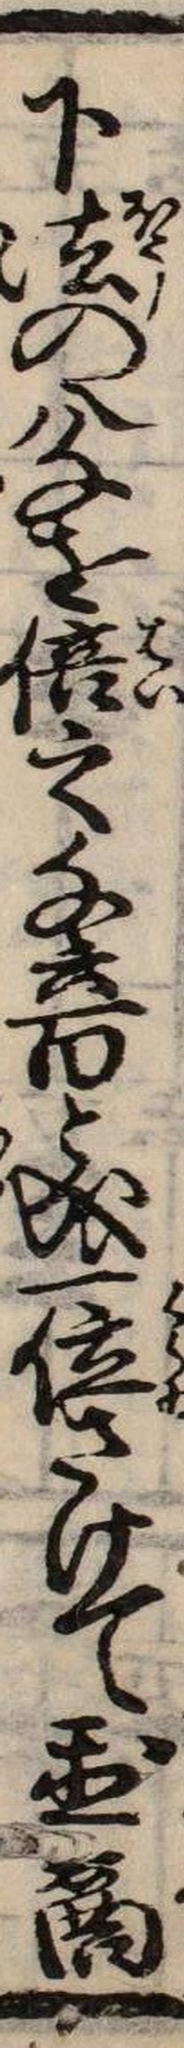下法の八千を倍之千立百と成一位さけて置商
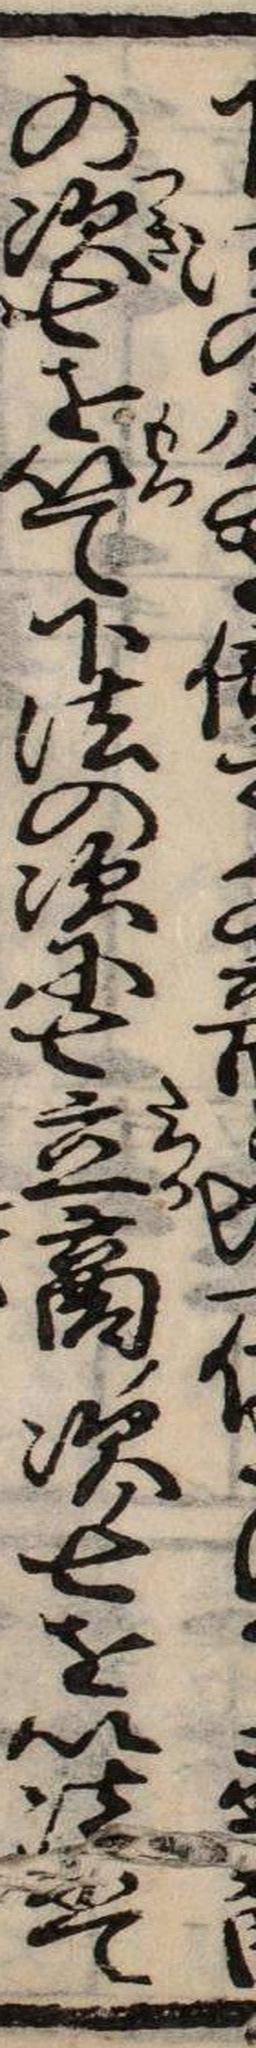の次七を以て下法の次に七立商の次の七を以法にて
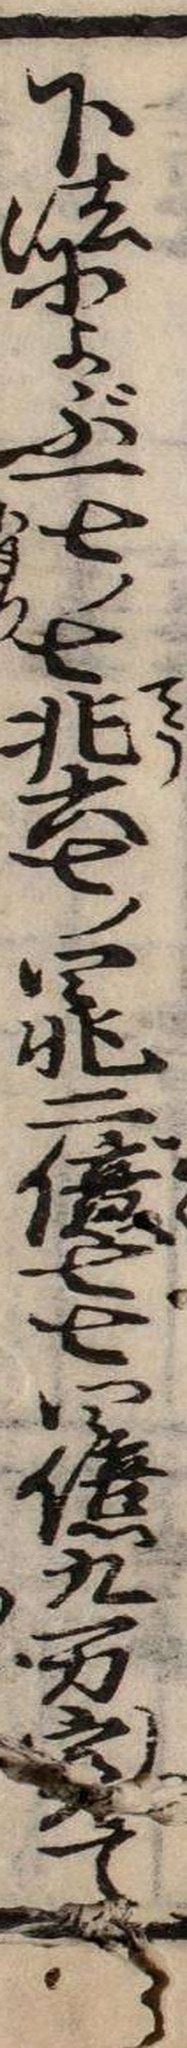下法によぶ一七の兆六七の四兆二億七七四億九万実て
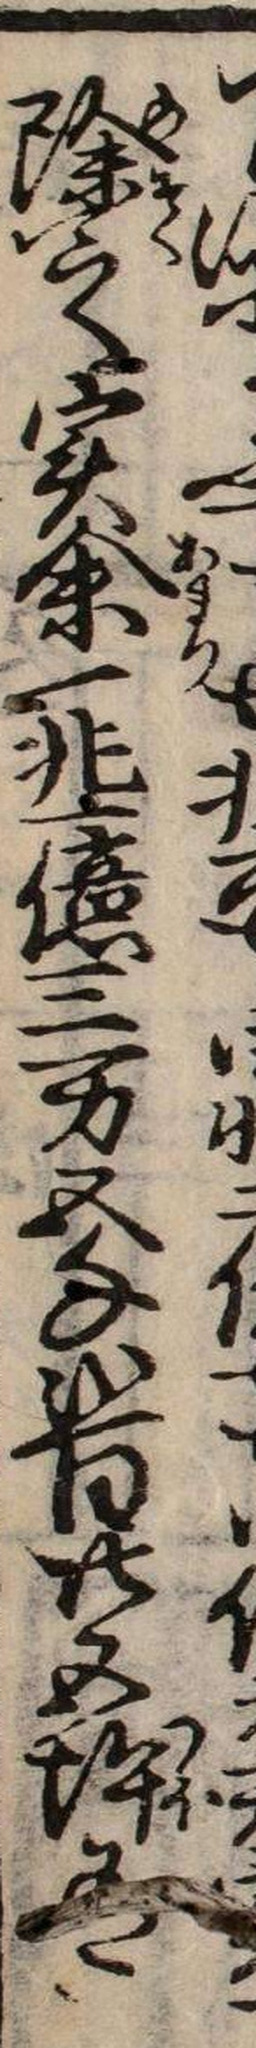除之実余一兆一億三万五千弐百廿五坪有

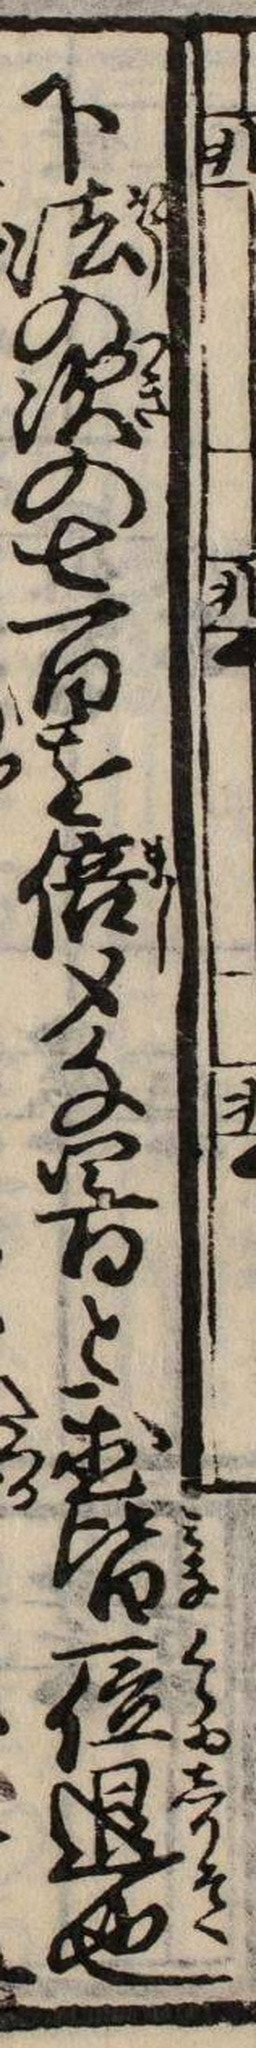下法の次の七百を倍〆千四百と置皆一位退也
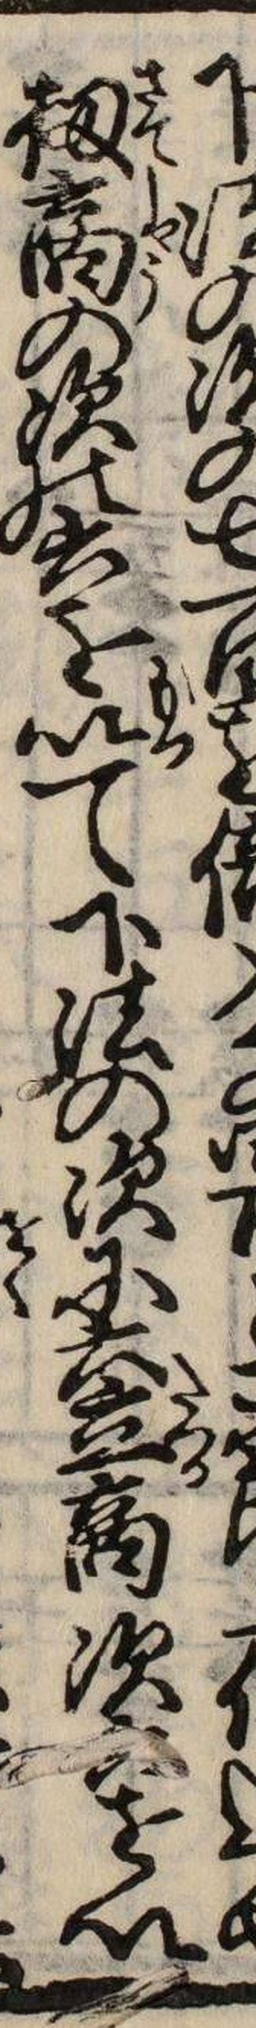扨商の次の六を以て下法の次に六立商次六を以
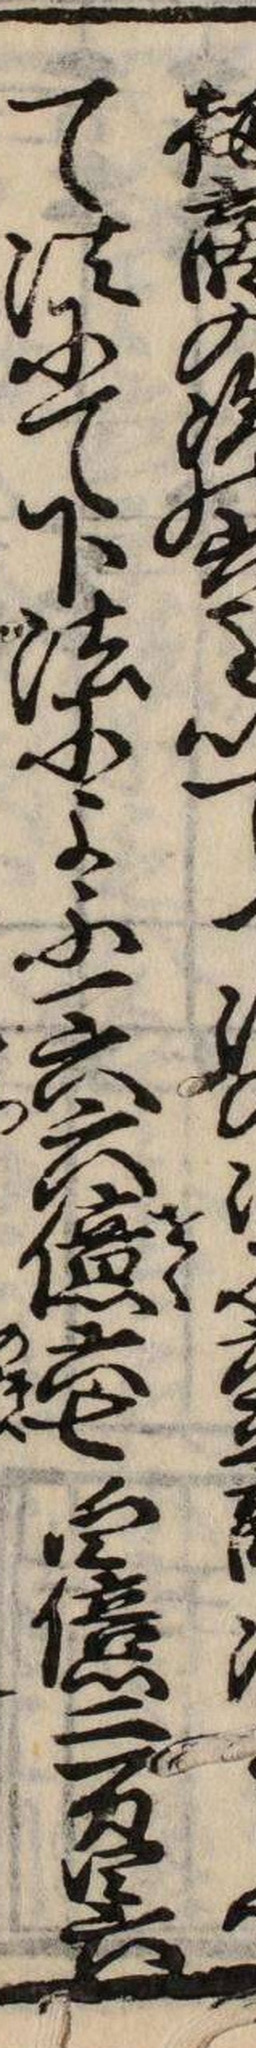て法にて下法によふ一六六億六七四億二万四六
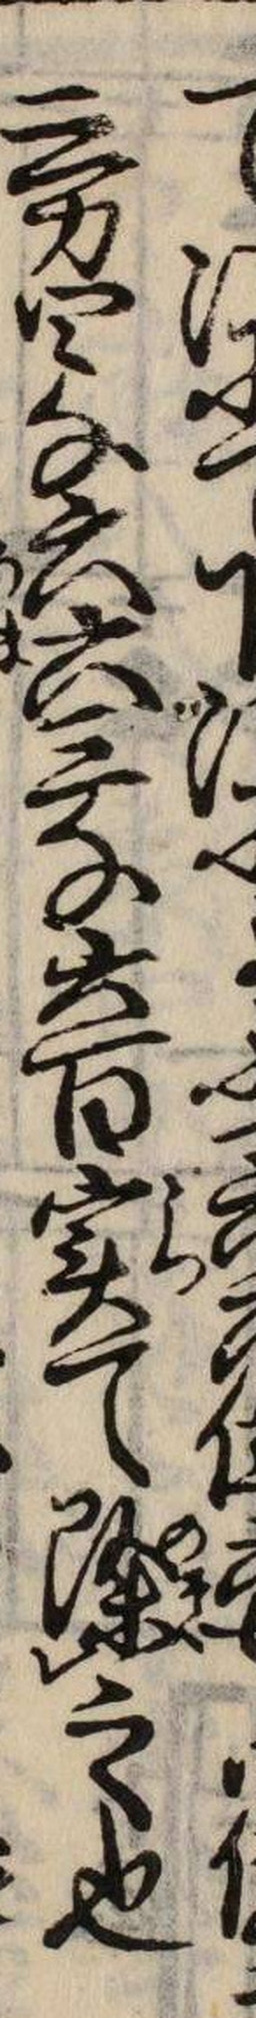二万四千六六三千六百実て除之也
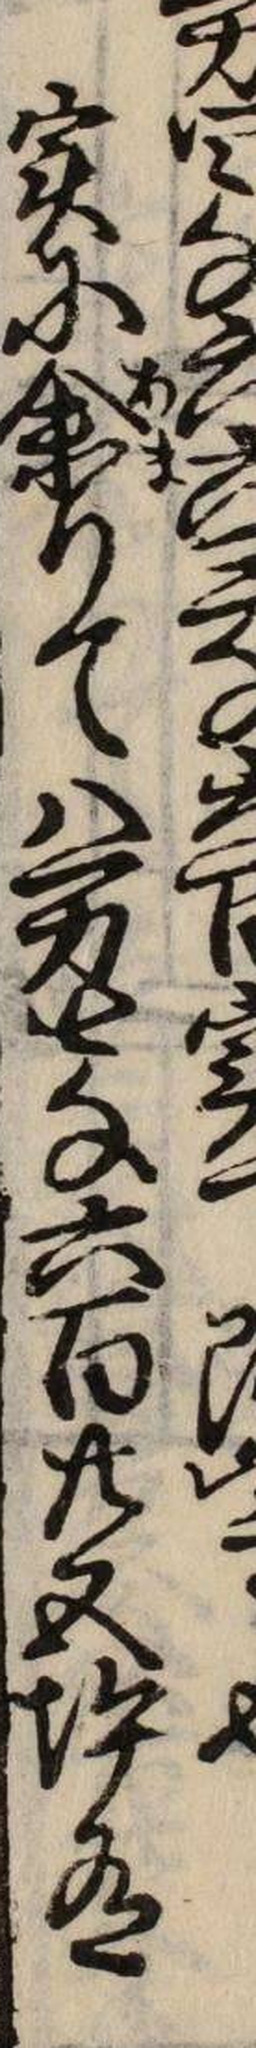実に余りて八万七千六百廿五坪有
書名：塵劫記（寛永11年自跋、京都府立京都学・歴彩館追貴8）
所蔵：京都府立京都学・歴彩館 国文学研究資料館
